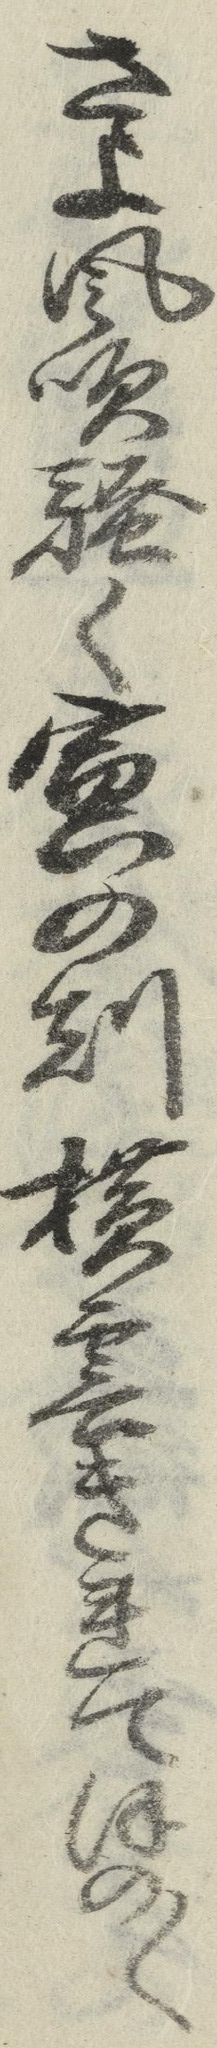さよ風吹騒く寅の刻横雲きれてほの〳〵
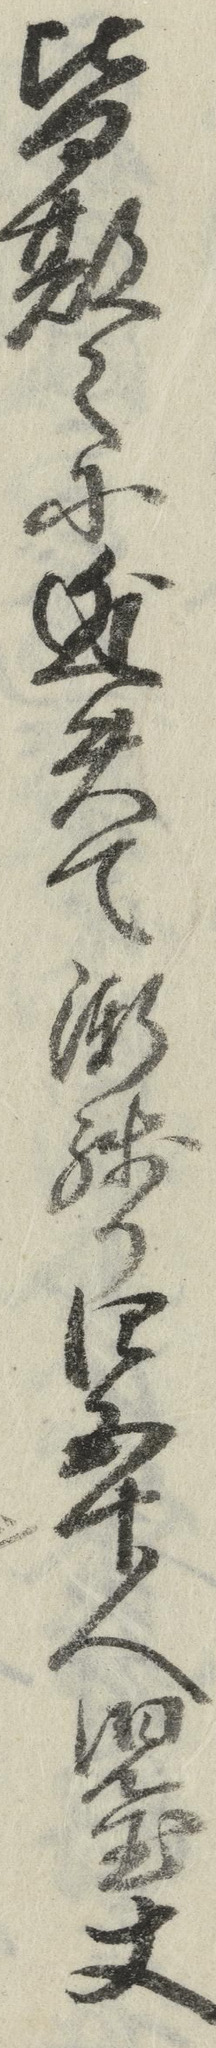皆散々に迯失て漸残り四五十人児玉丈
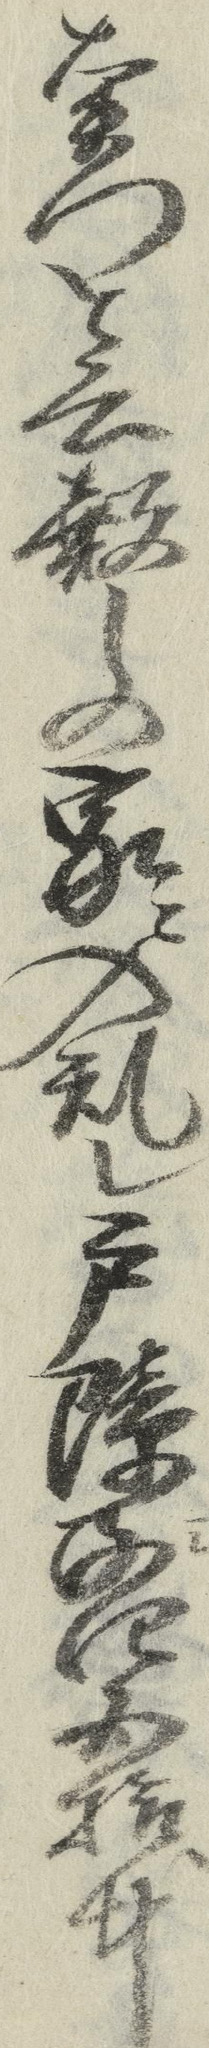右衛門と云穀しの家に入乱レ戸障子四五拾本
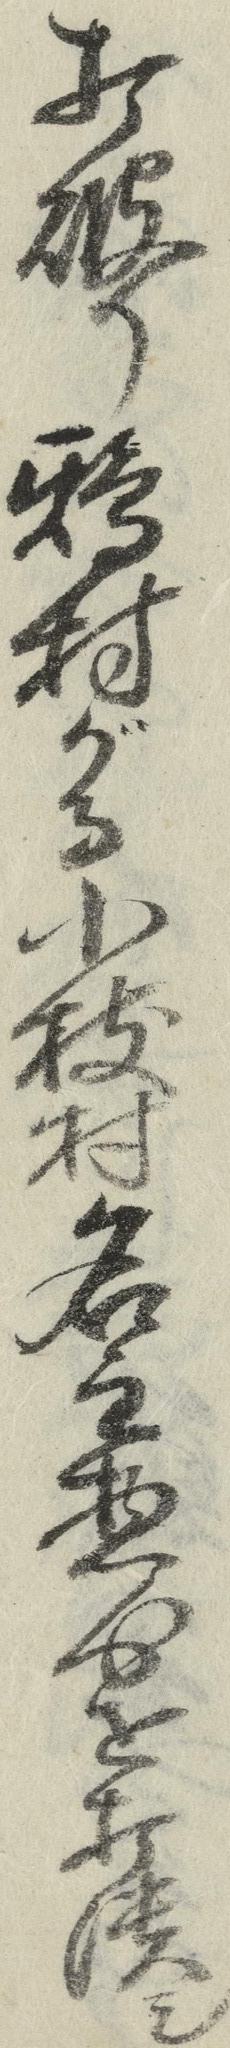打破り鴉村がる小枝村名主惣衛門を打潰シ
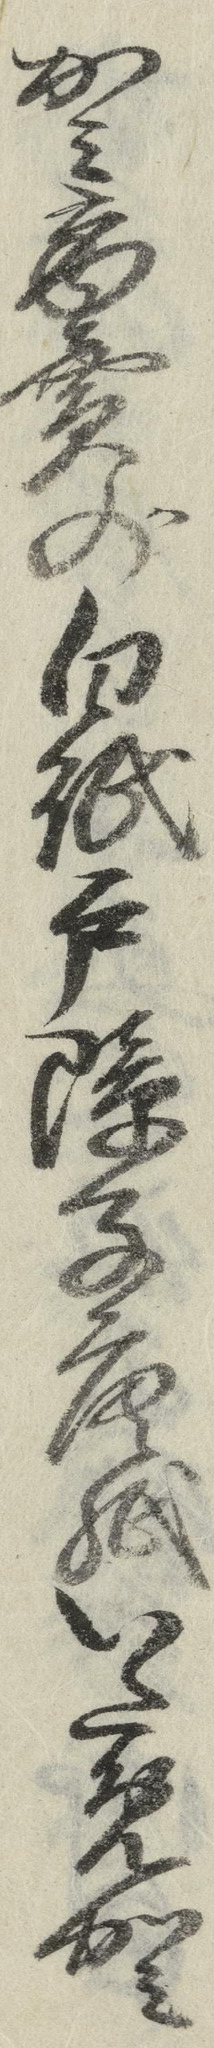かみ商売が白紙戸障子唐紙いためかみ
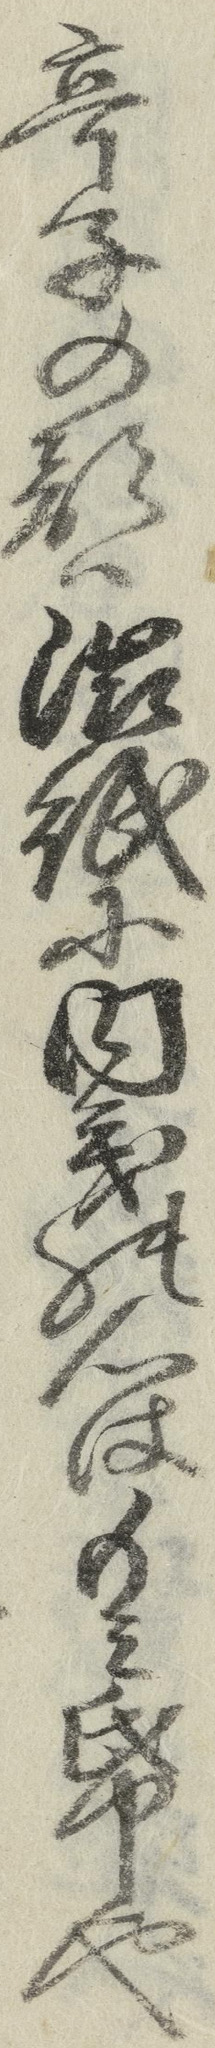亭子の類は渋紙に内義の心はもみ帋や
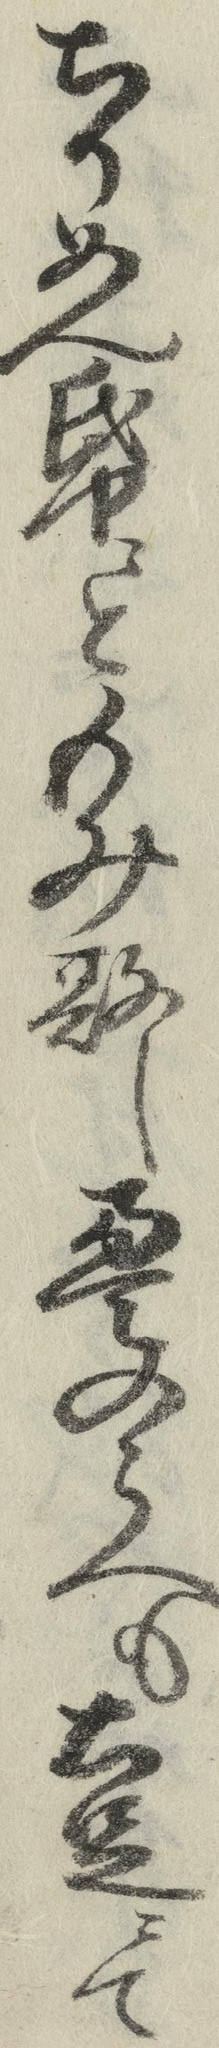ちりめん帋にともみ散し畳のうへも土足にて

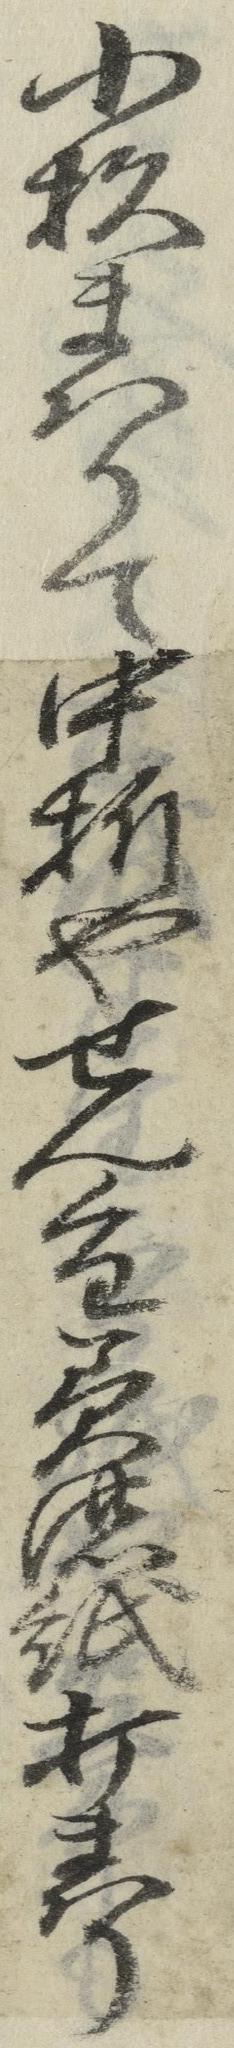小杦まはりて中折やせん金美濃紙打まはり
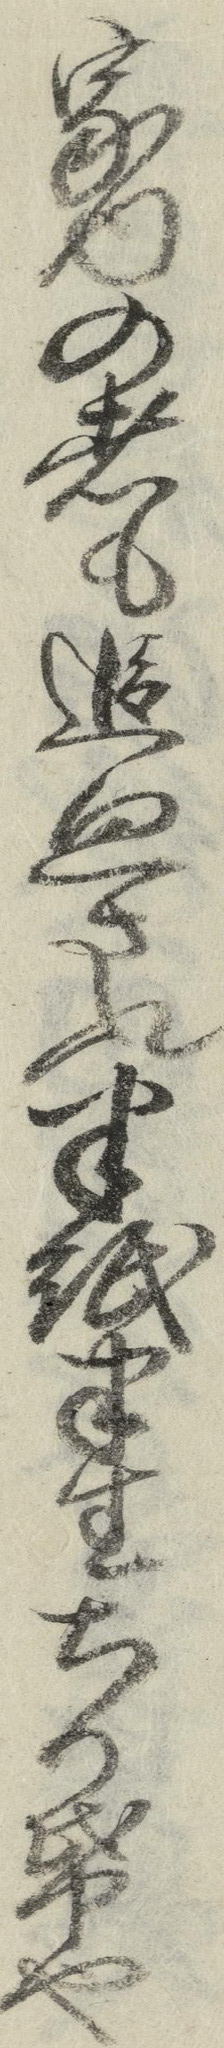家内の者も追廻され半紙半生ちり帋や
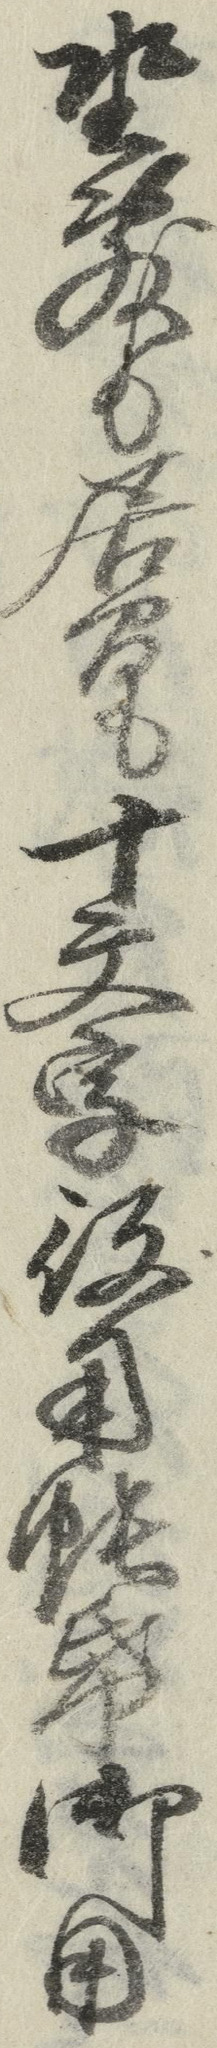座敷も居間も十文字役用帳帋御用
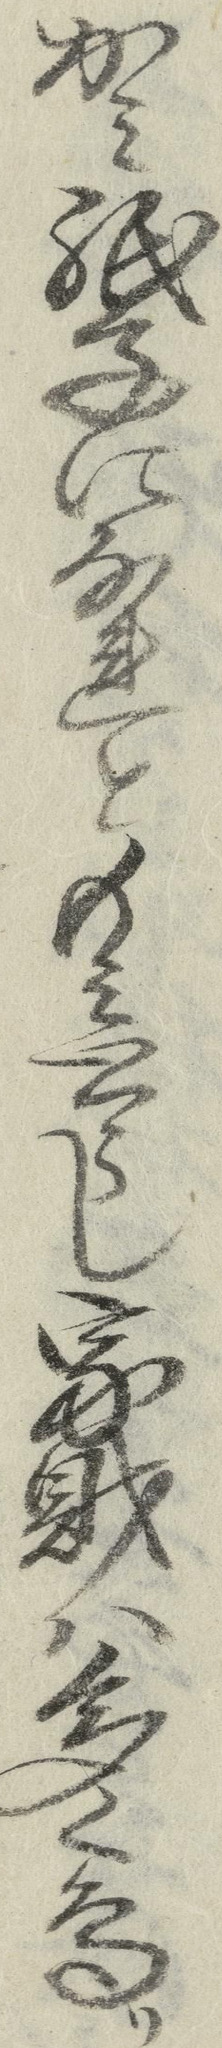かみ紙子になれともみとらし家財は多く鳥
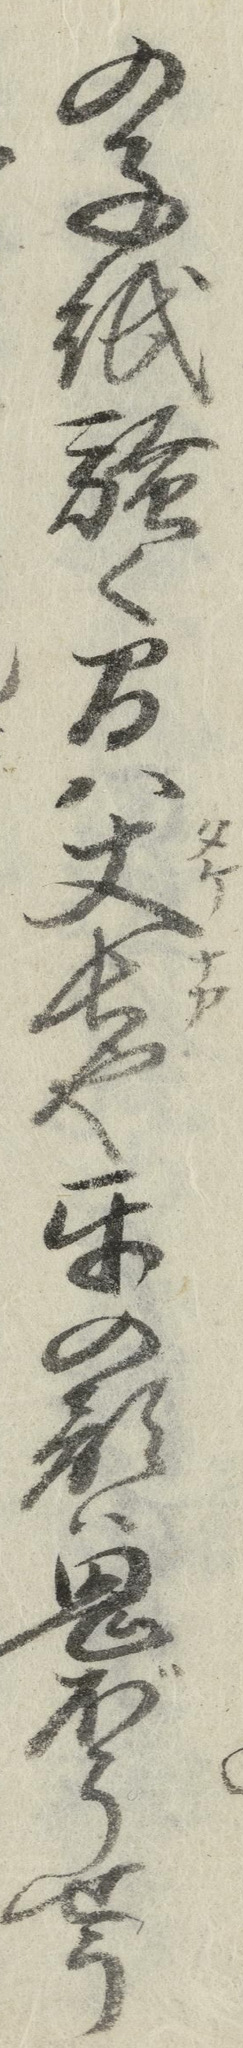の子紙騒く間は丈長や互の顔は鬼ぼうせう
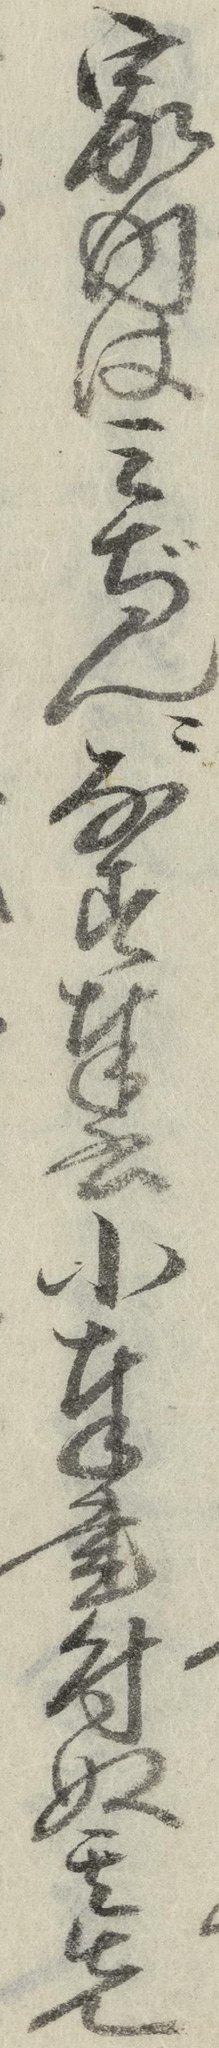家内はみぢンになす奉公小奉書付ぬ其先
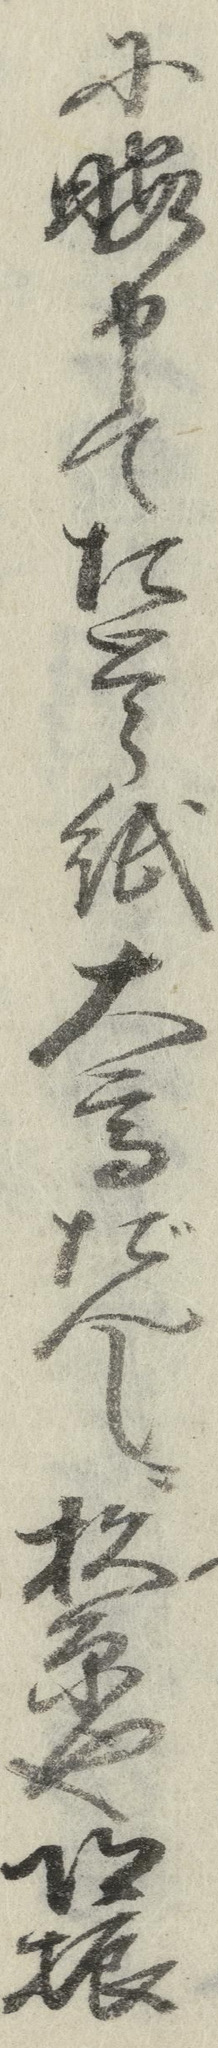に晦申てたとう紙大高だんしに杦原や跡振
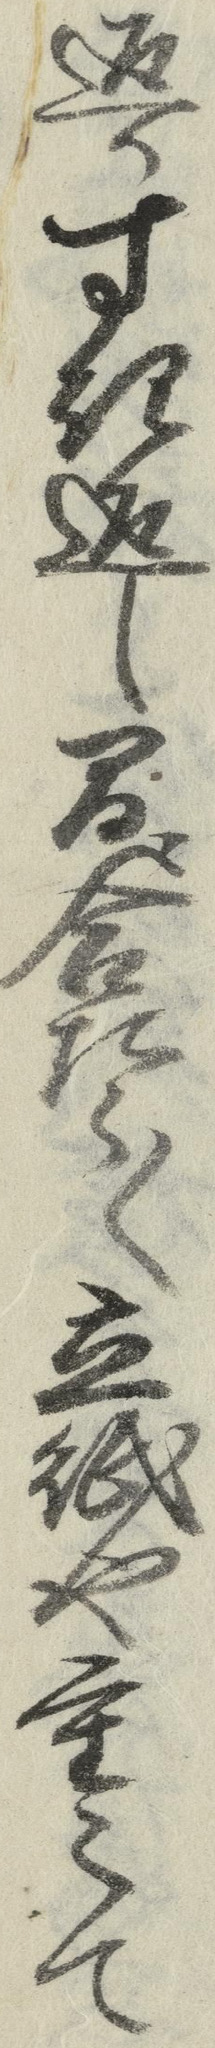返りすき返し間合たら〳〵立紙や重々て
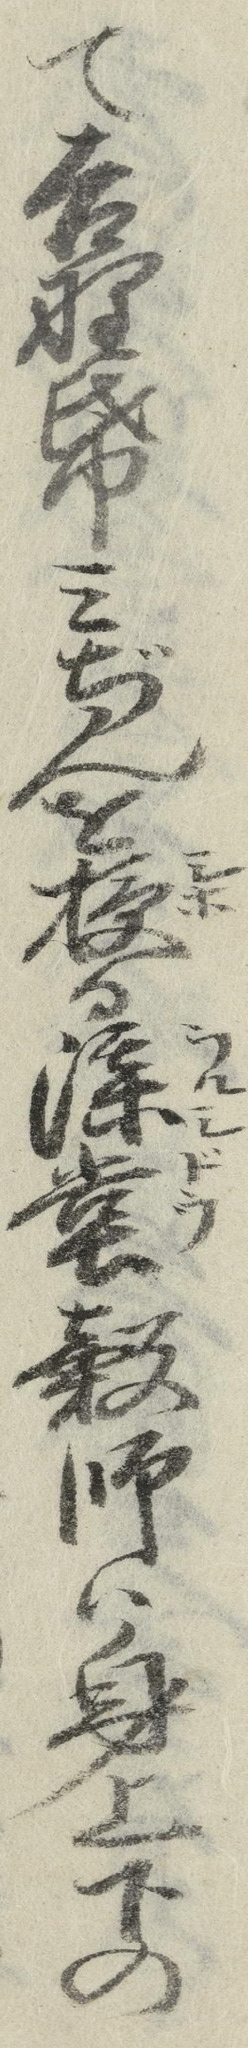て吉野帋みぢんを梗る漆堂穀師は身上下の
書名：浅間大焼騒動記　下
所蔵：東京大学地震研究所図書室 Earthquake Research Institute Library, The University of Tokyo, JAPAN
